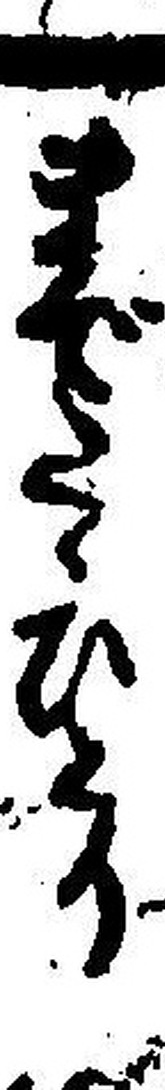までたゝひとり
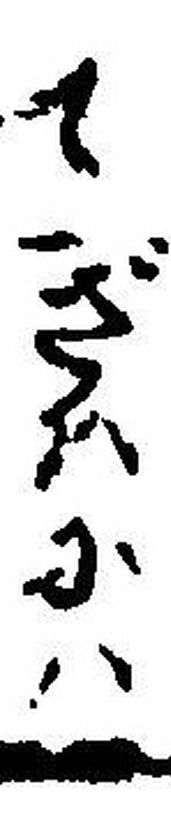てぎはには
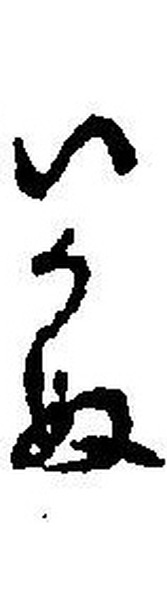いかぬ
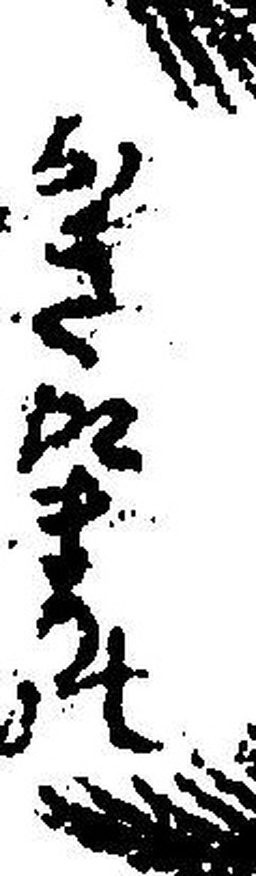おさたまりの
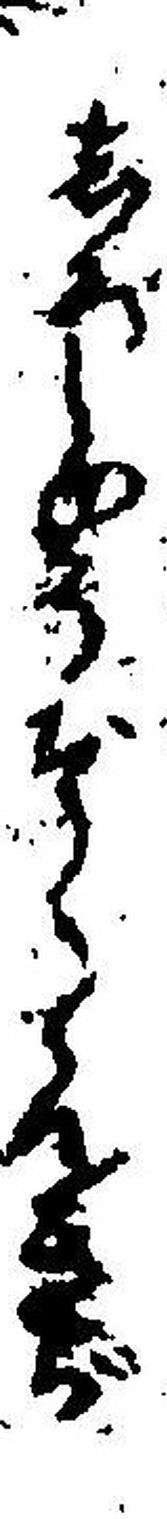しろしやうぞくてんきが
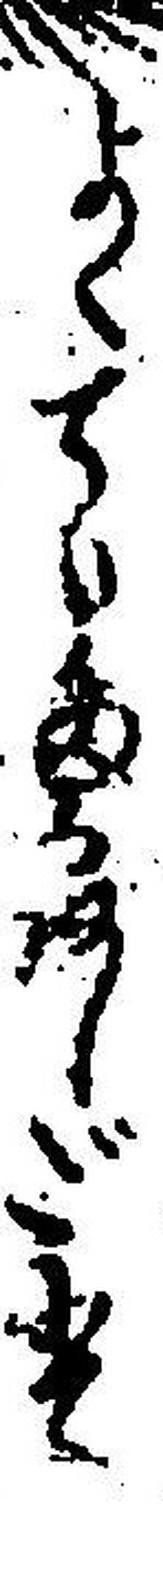よくてもたかあしだにて
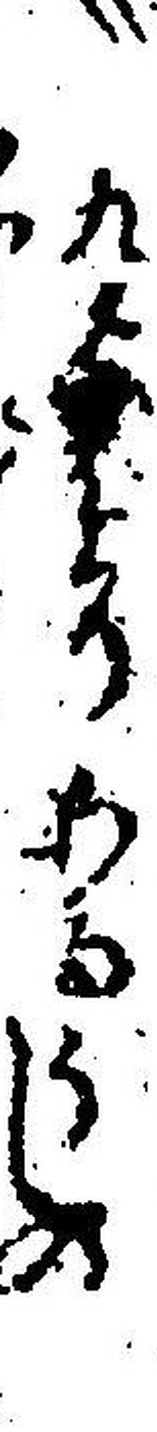九ばかりあるうしの
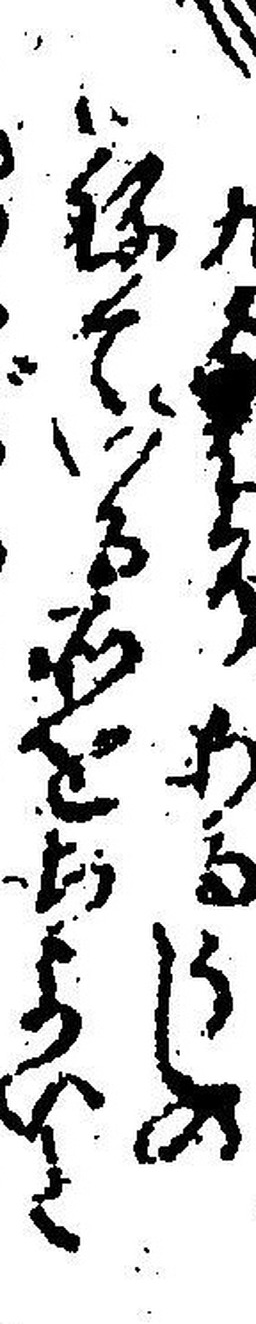ねている所をちよいと
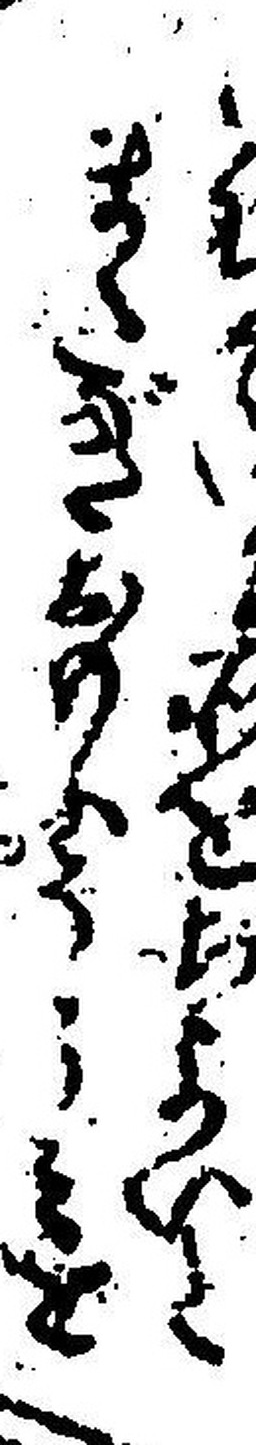またぎおもふうらみを
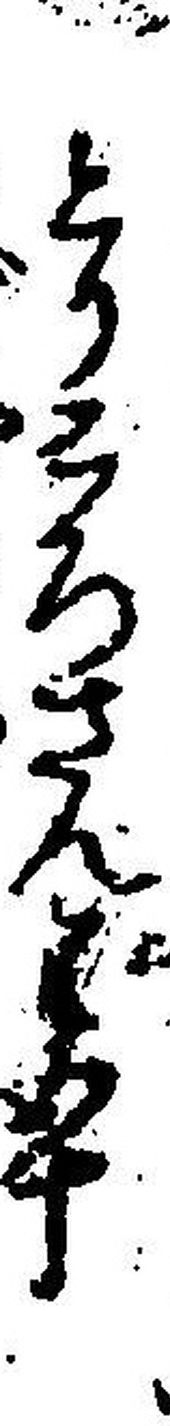とりころさんと五寸
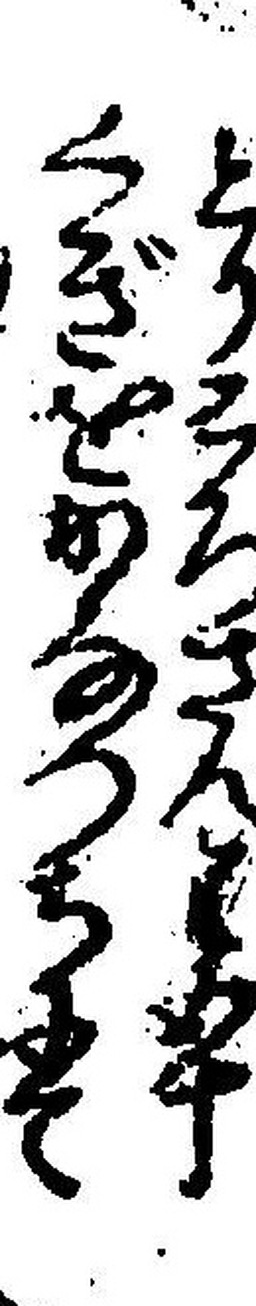くぎをかなつちにて
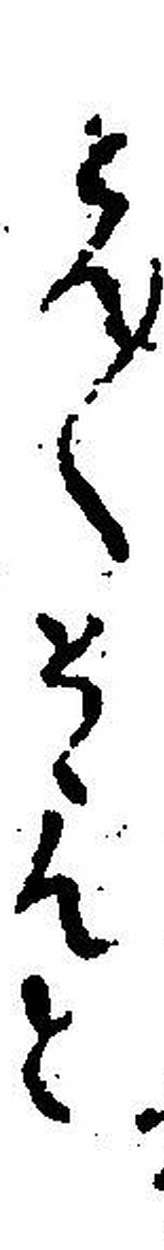とん〳〵とゝんと
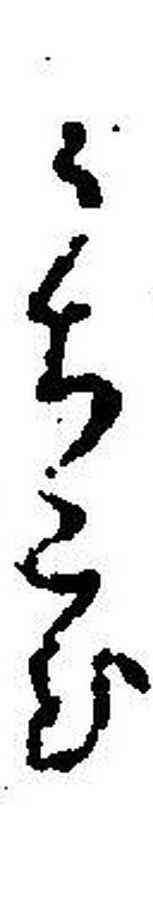うちこむ

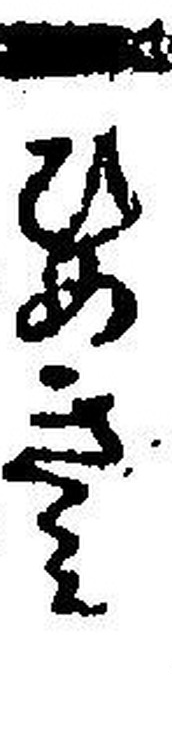ひめきみ
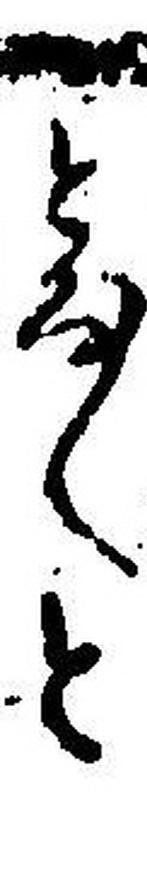とろ〳〵と
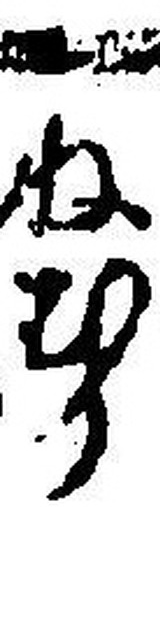ねむり
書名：御代参牛時詣 / 市場通笑作
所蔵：東京大学総合図書館 General Library in the University of Tokyo, JAPAN
